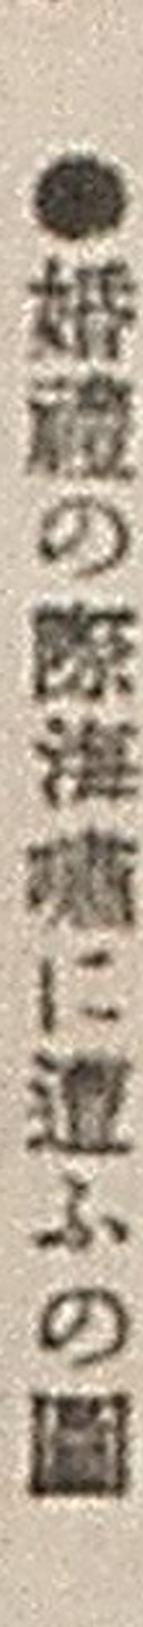●婚礼の際海嘯に遭ふの図
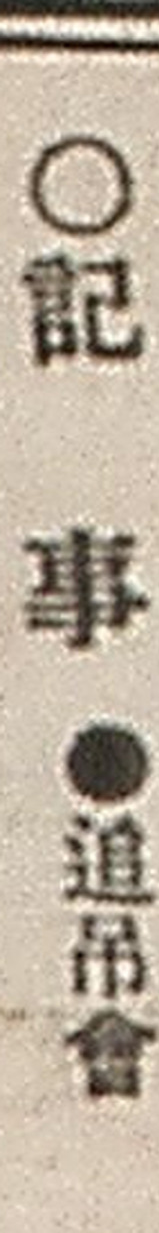〇記事●追吊会
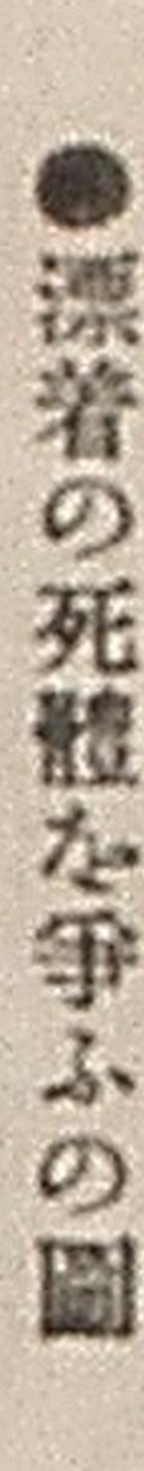●漂着の死体を争ふの図
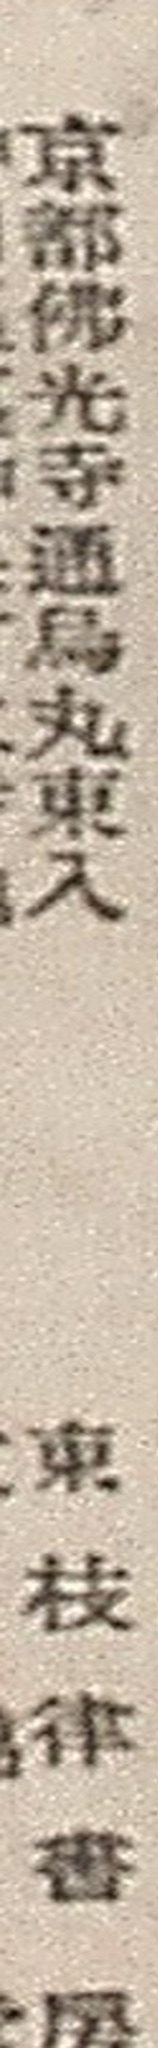京橋仏光寺通烏丸東入東枝律書房
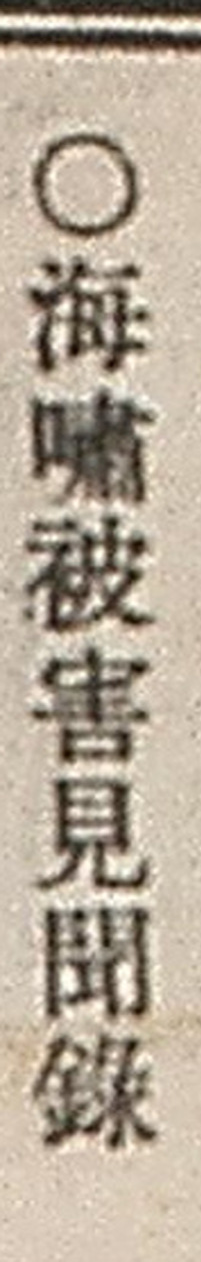〇海嘯被害見聞録
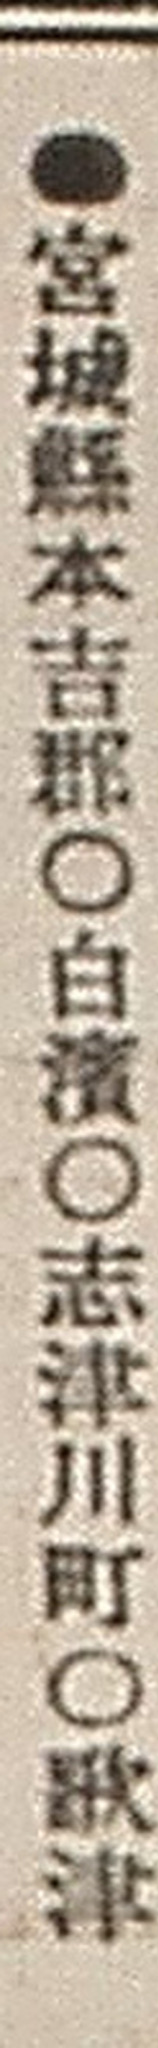●宮城県本吉郡〇白浜〇志津川町〇歌津
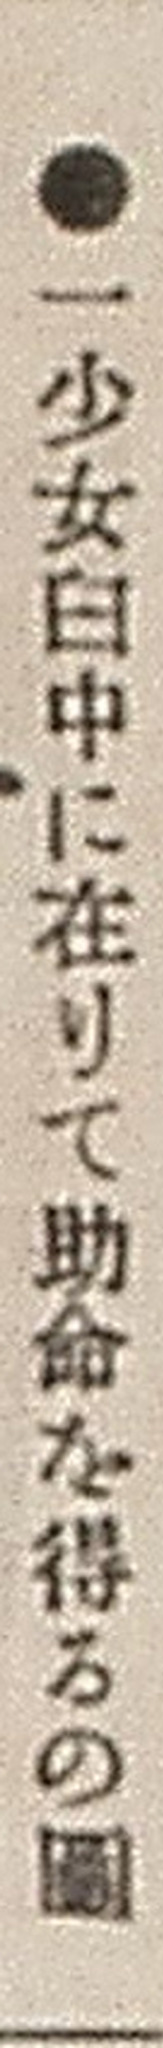●一少女臼中に在りて助命を得るの図
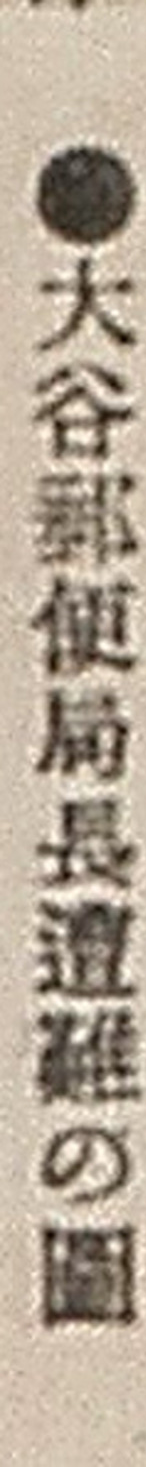●大谷郵便局長遭難の図
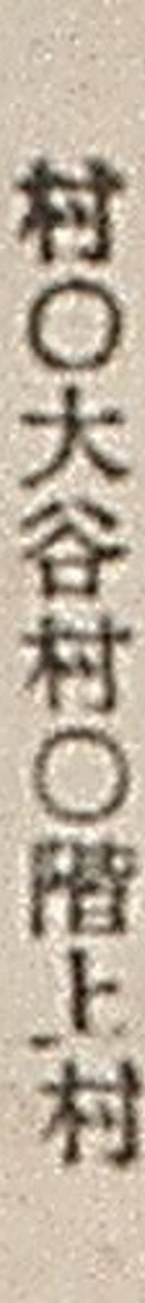村〇大谷村〇階上村
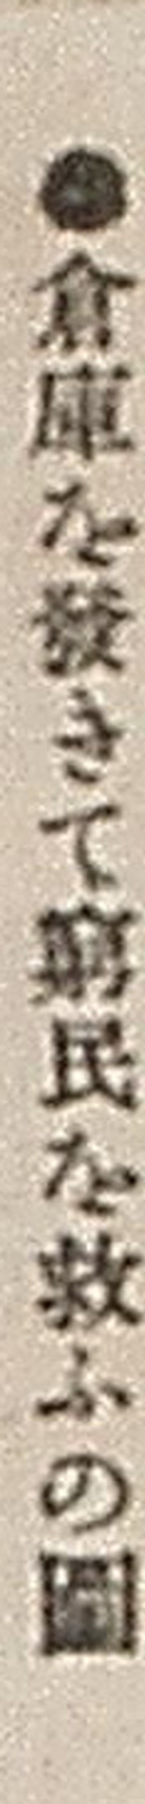●倉庫を発きて窮民を救ふの図
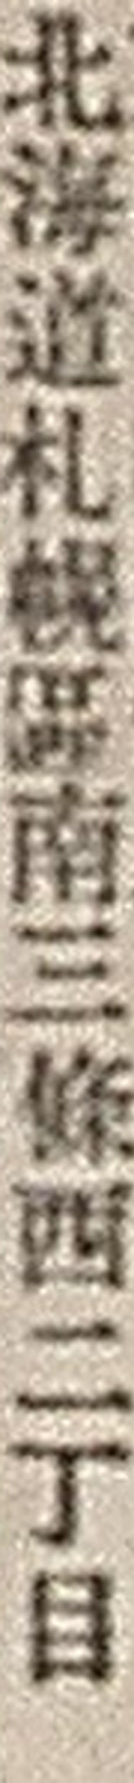北海道札幌南一条西二丁目玉振堂
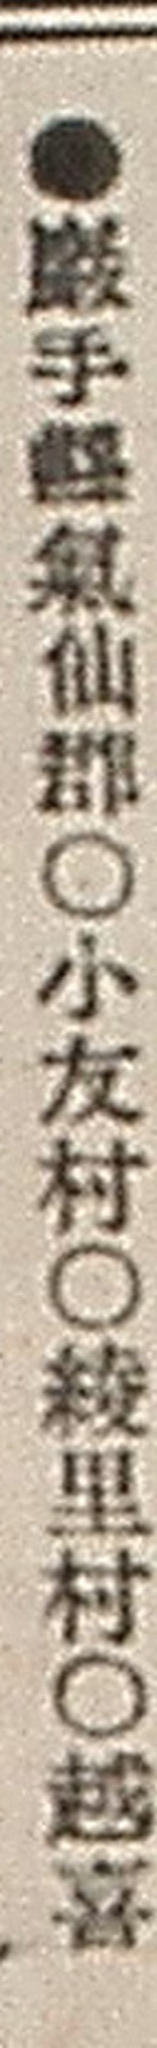●岩手県気仙郡〇小友村〇綾里村〇越喜
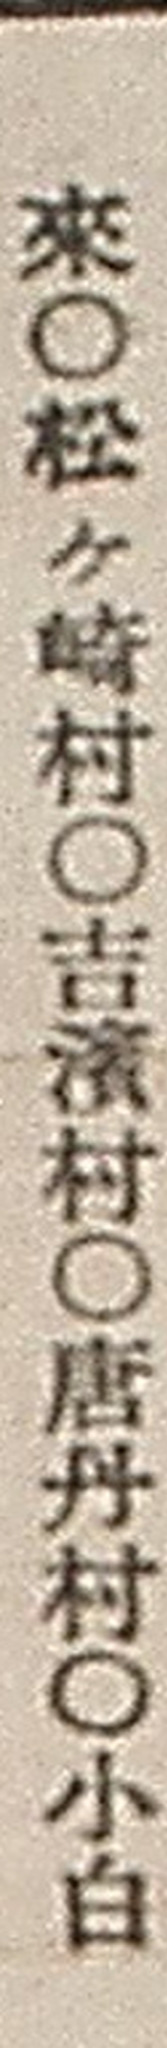来〇松ケ崎村〇吉浜村〇唐丹村〇小白
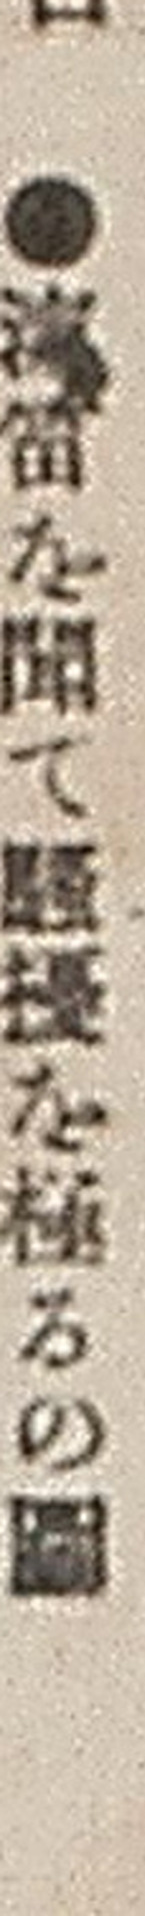●汽笛を聞て騒擾を極るの図
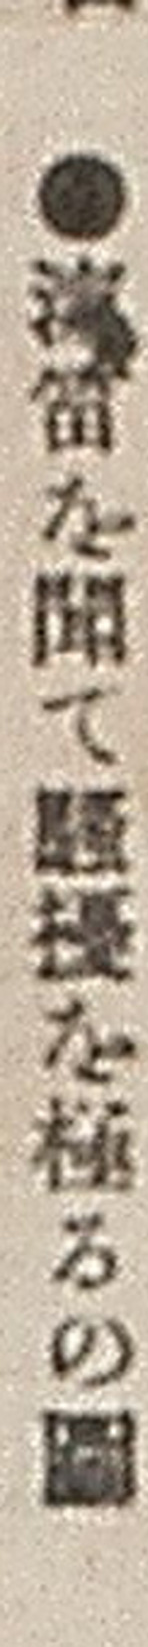●汽笛を聞て騒擾を極るの図
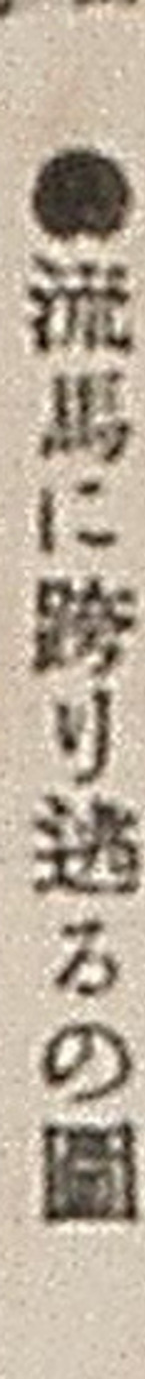●流馬に跨り逃るの図
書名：風俗畫報臨時増刊第百二十號　大海嘯被害録（下）
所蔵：東京大学地震研究所図書室 Earthquake Research Institute Library, The University of Tokyo, JAPAN
